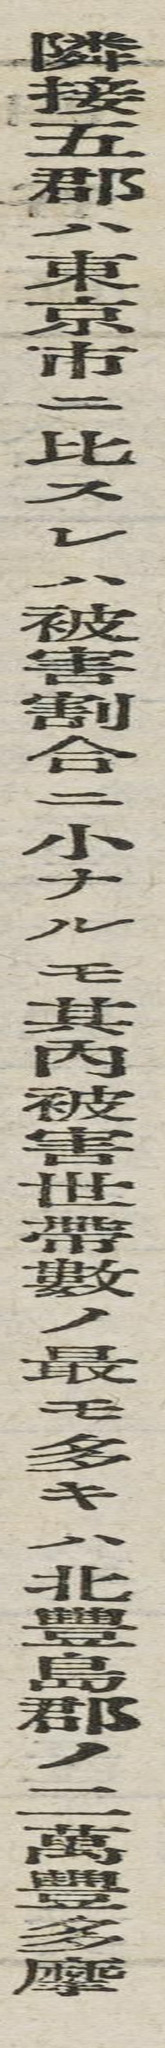隣接五郡ハ東京市ニ比スレハ被害割合ニ小ナルモ其内被害世帯数ノ最モ多キハ北豊島郡ノ二万豊多摩
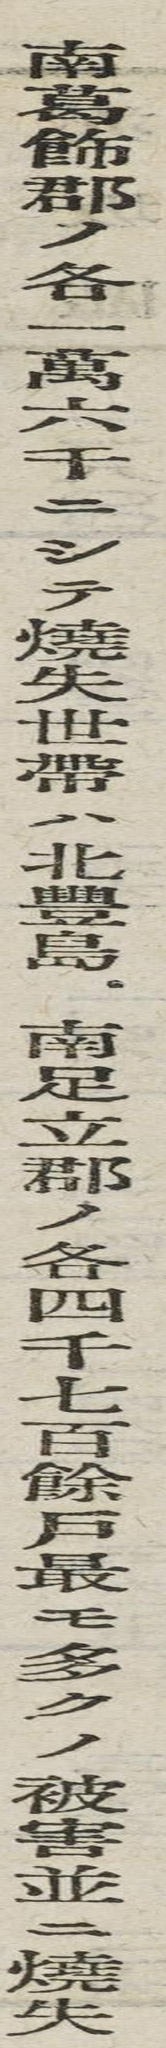南葛飾郡ノ各一万六千ニシテ焼失世帯ハ北豊島、南足立郡ノ各四千七百余戸最モ多クノ被害並ニ焼失
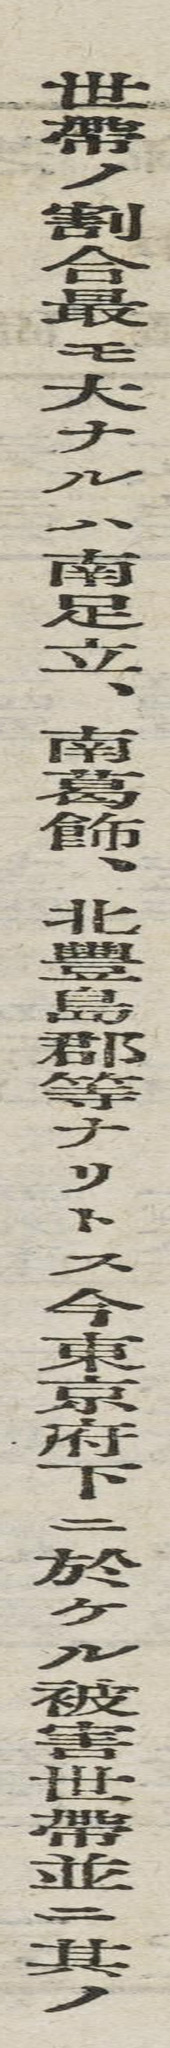世帯ノ割合最モ大ナルハ南足立、南葛飾、北豊島郡等ナリトス今東京府下ニ於ケル被害世帯並ニ其ノ
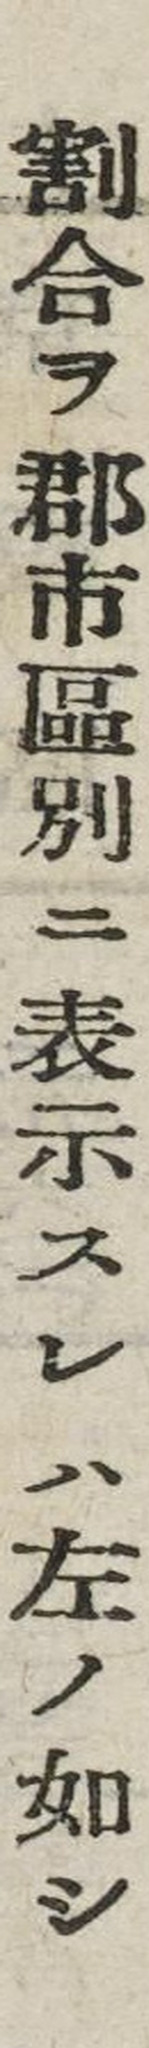割合ヲ郡市区別ニ表示スレハ左ノ如シ
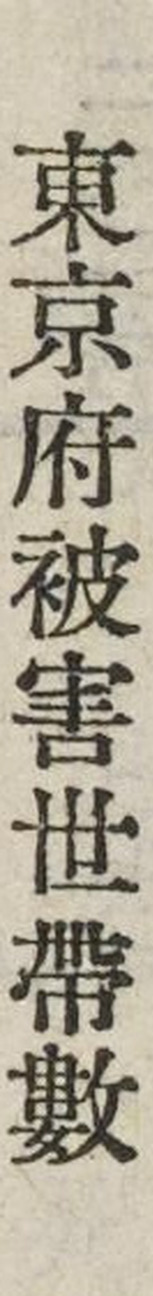東京府被害世帯数
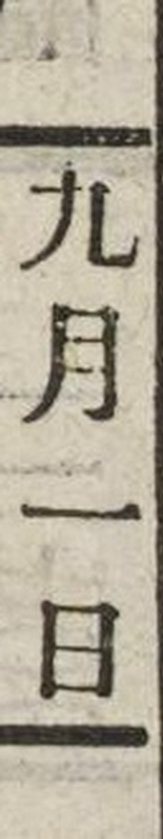九月一日
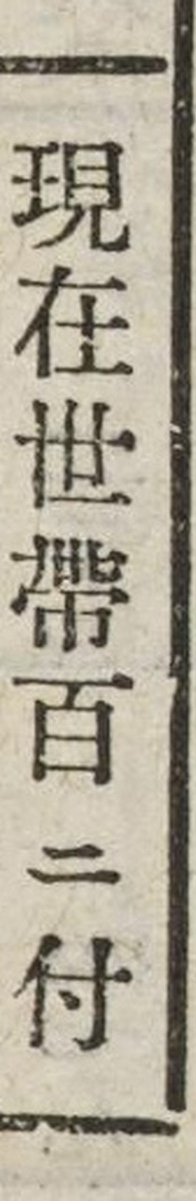現在世帯百ニ付

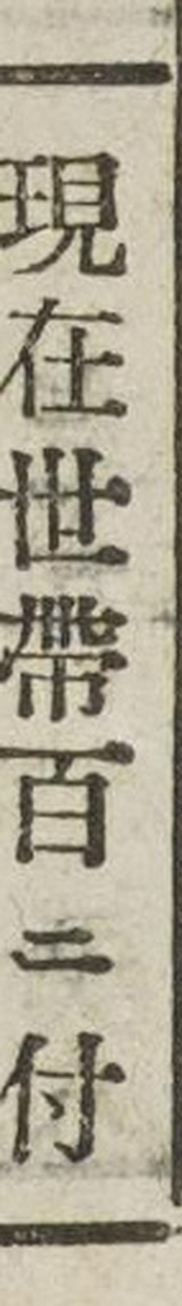現在世帯百ニ付
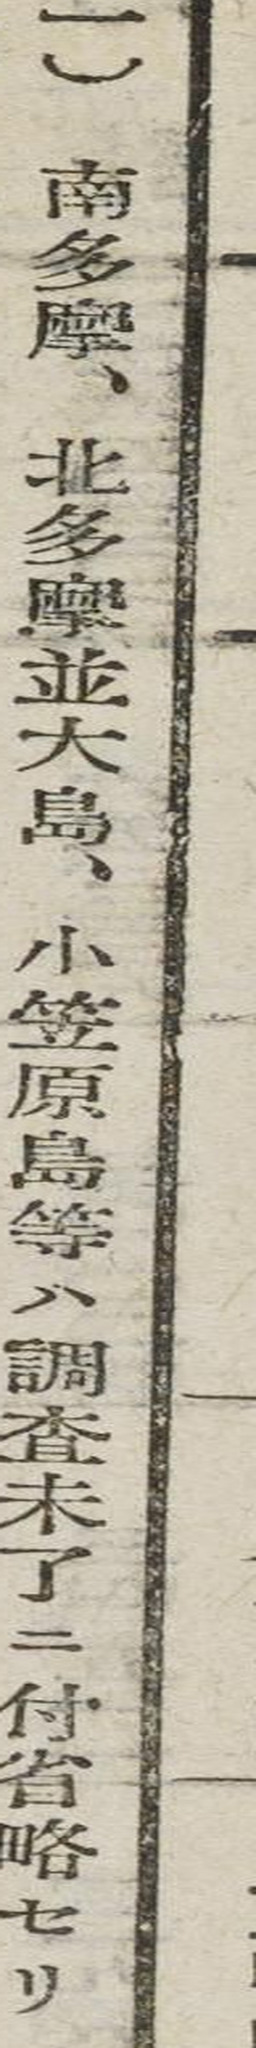備考南多摩、北多摩並大島、小笠原島等ハ調査未了ニ付省略セリ
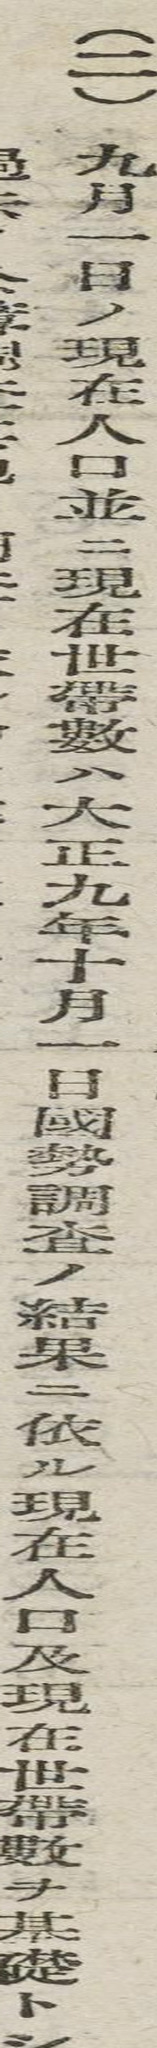九月一日ノ現在人口並ニ現在世帯数ハ大正九年十月一日国勢調査ノ結果ニ依ル現在人口及現在世帯数ヲ基礎トシ
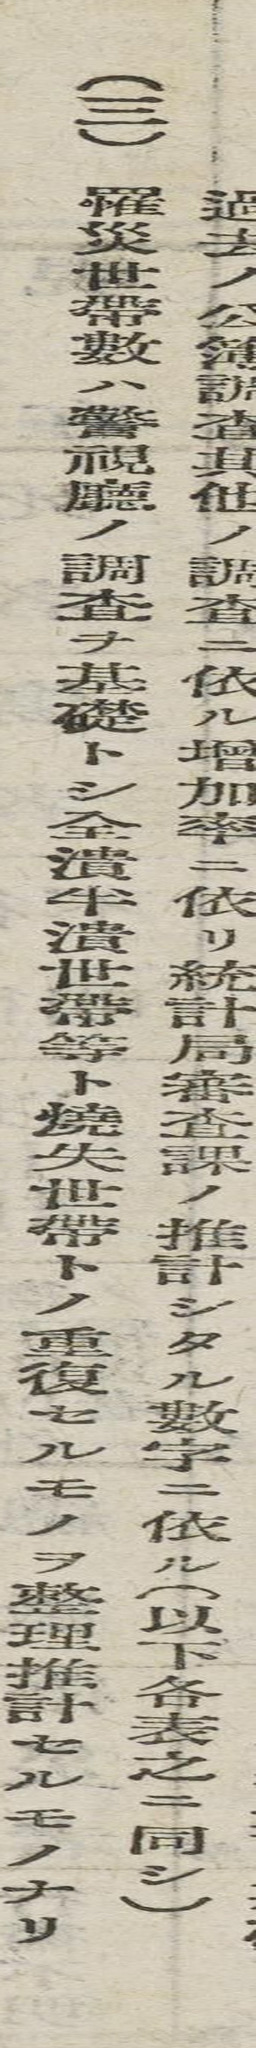罹災世帯数ハ警視庁ノ調査ヲ基礎トシ全潰半潰世帯等ト焼失世帯トノ重複セルモノヲ整理推計セルモノナリ
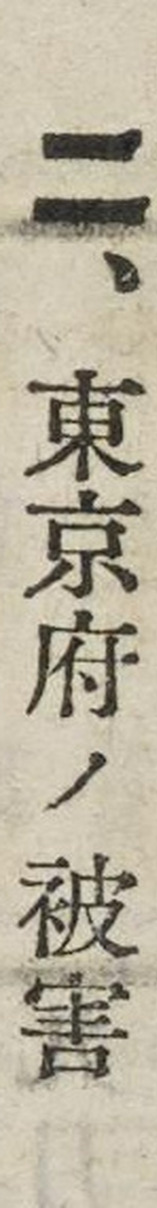ニ、東京府ノ被害
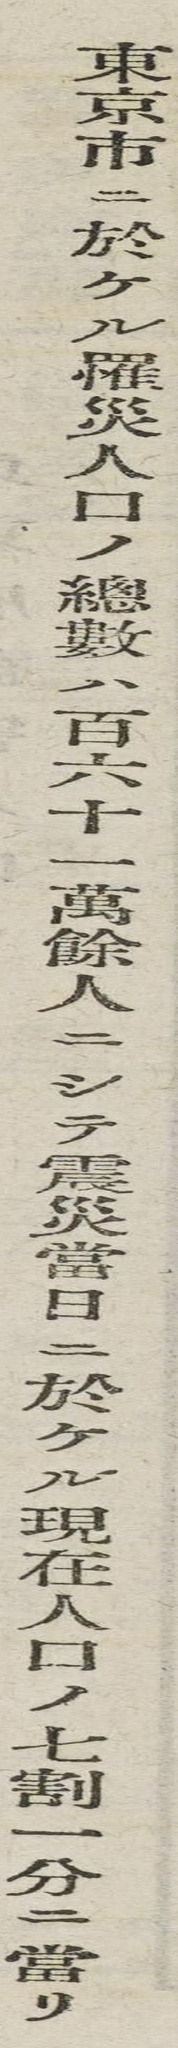東京市ニ於ケル罹災人口ノ総数ハ百六十一万余人ニシテ震災当日ニ於ケル現在人口ノ七割一分ニ当リ
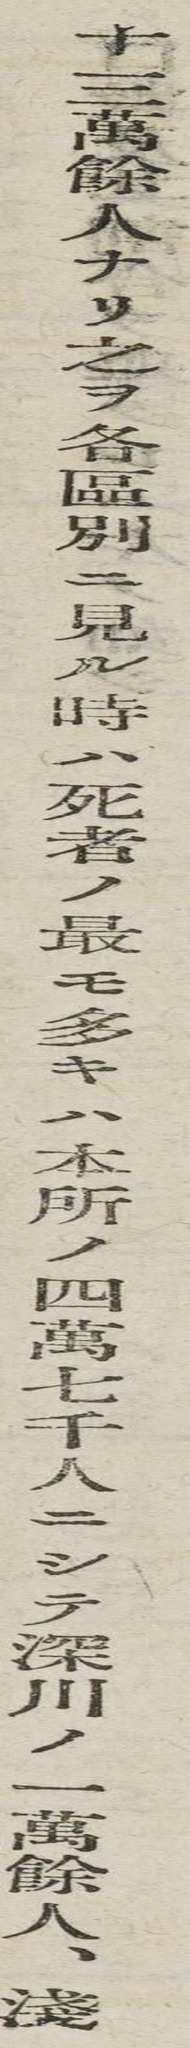十三万余人ナリ之ヲ各区別ニ見ル時ハ死者ノ最モ多キハ本所ノ四万七千人ニシテ深川ノ一万余人、浅
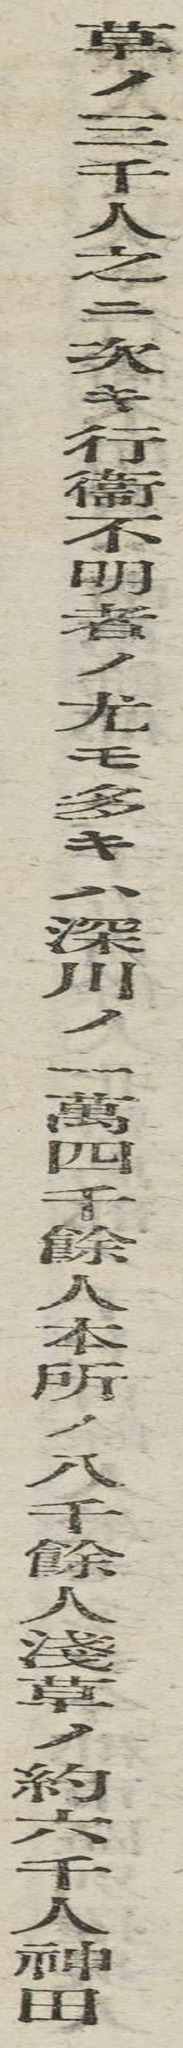草ノ三千人之ニ次キ行方不明者ノ尤モ多キハ深川ノ一万四千余人本所ノ八千余人浅草ノ約六千人神田
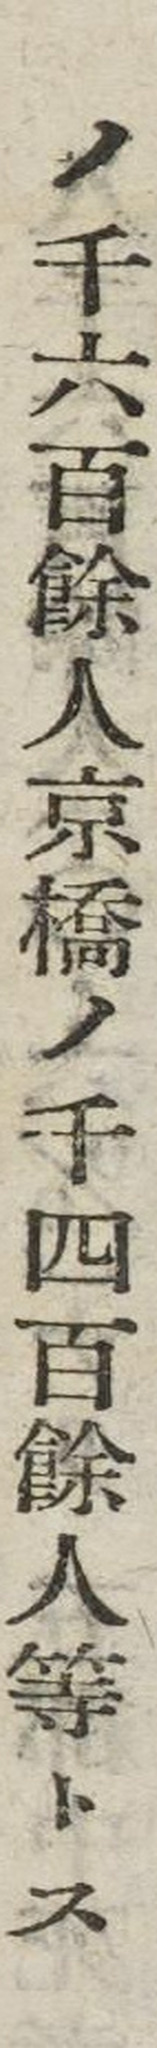ノ千六百余人京橋ノ千四百余人等トス
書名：震災被害状況並救護施設概要
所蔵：東京大学地震研究所図書室 Earthquake Research Institute Library, The University of Tokyo, JAPAN
